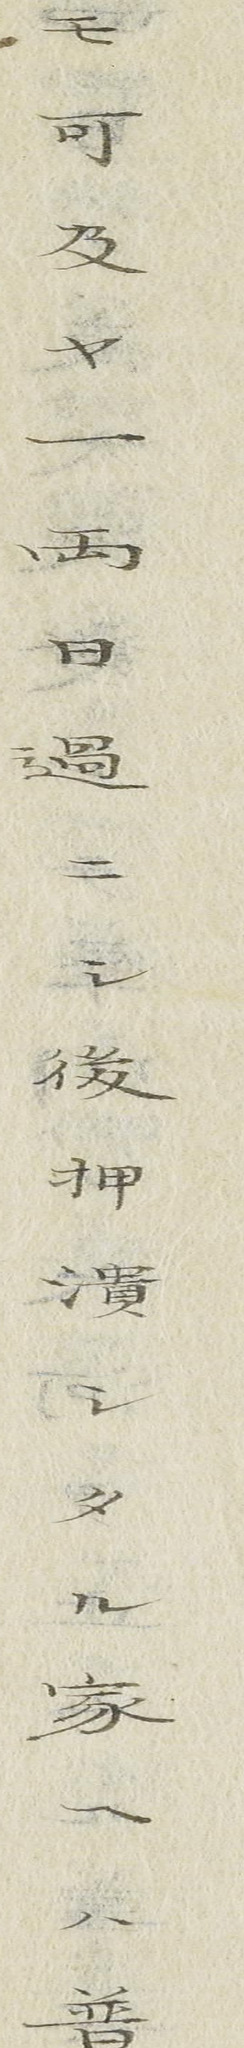モ可及ヤ一両日過ニシ後押潰シタル家ヘハ普
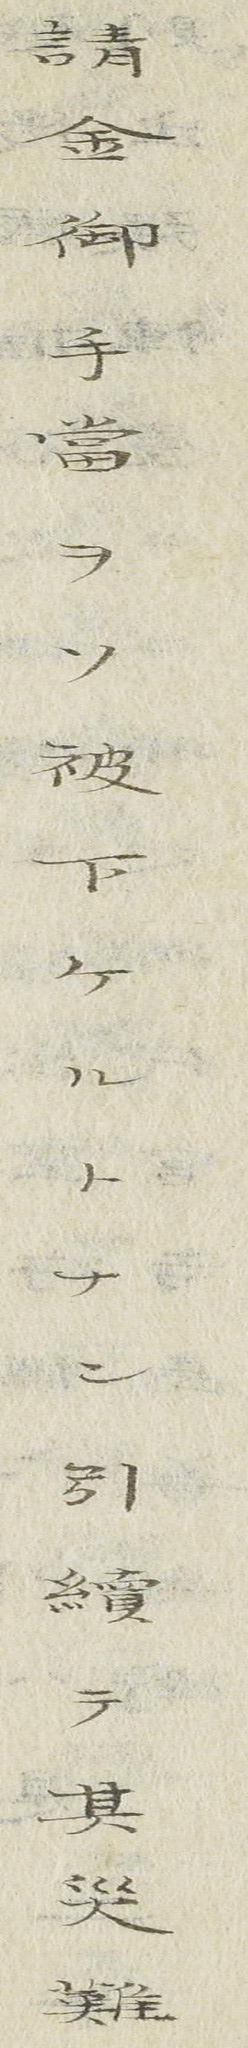請金御手当ヲソ被下ケルトナン引続テ其災難
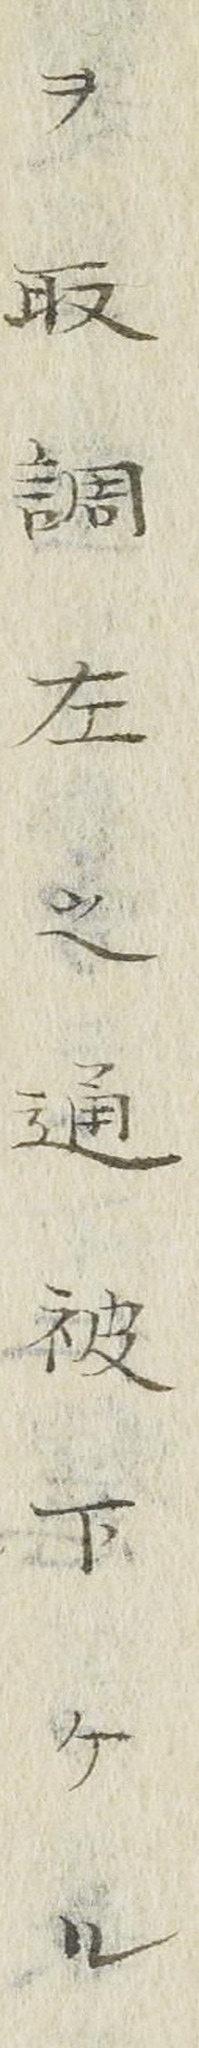ヲ取調左之通被下ケル
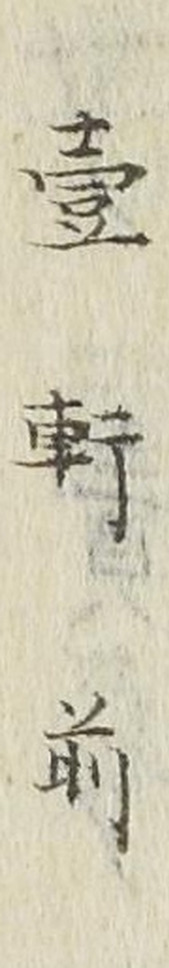壱軒前
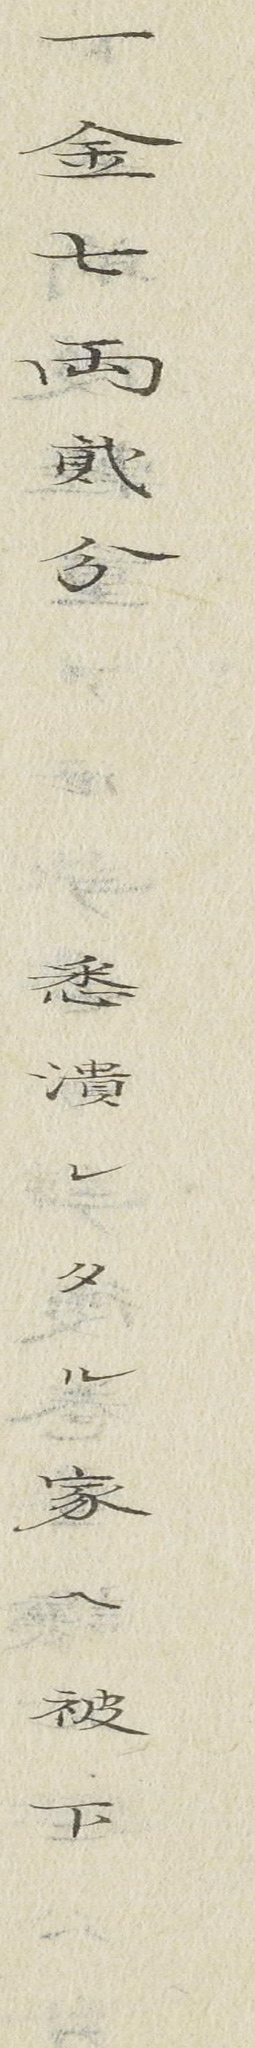一金七両弐分悉潰レタル家ヘ被下
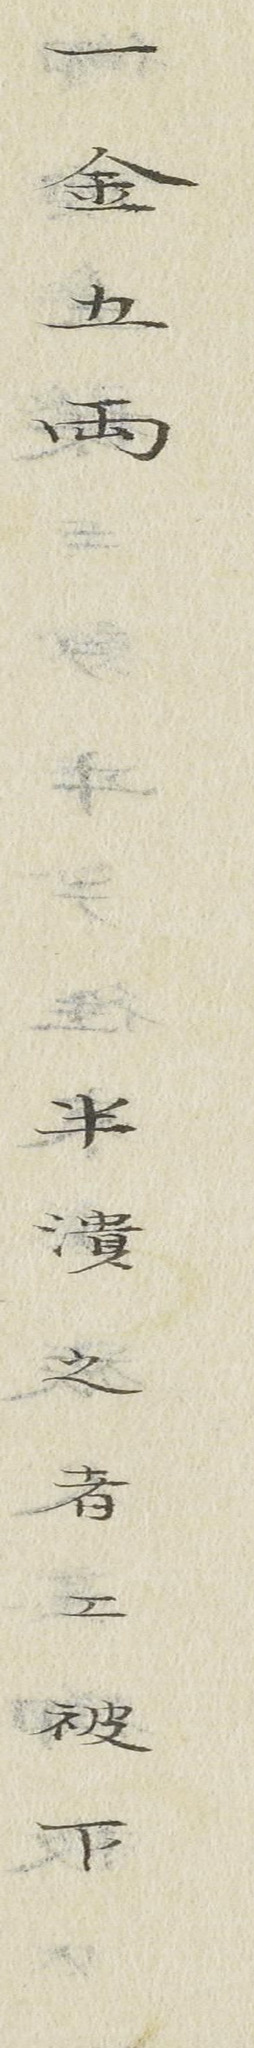一金五両半潰之者エ被下
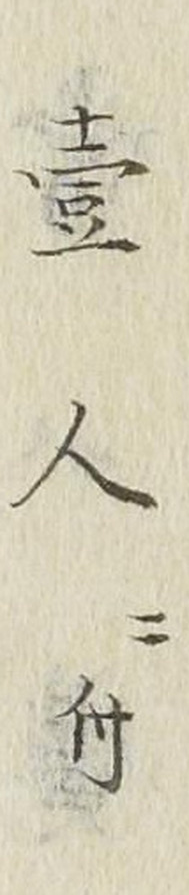壱人ニ付
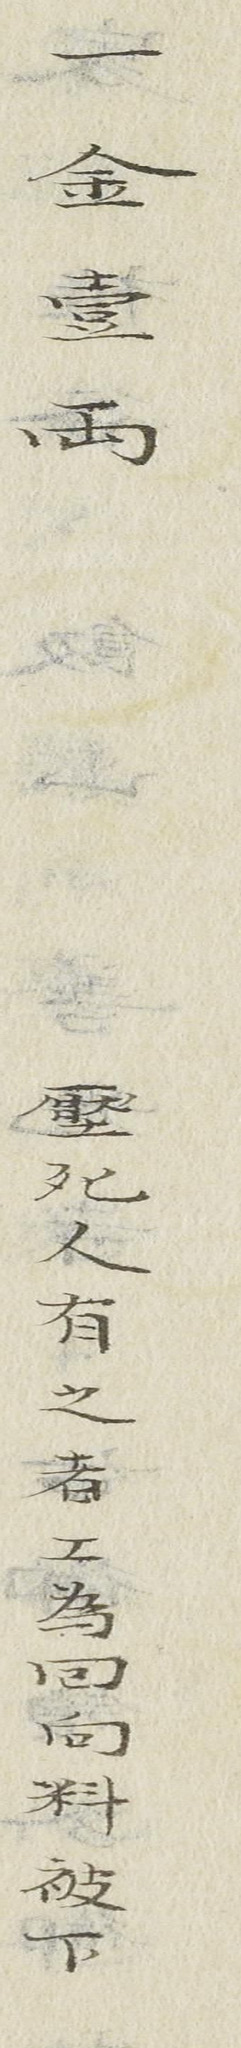一金壱両圧死人有之者エ為回向料被下
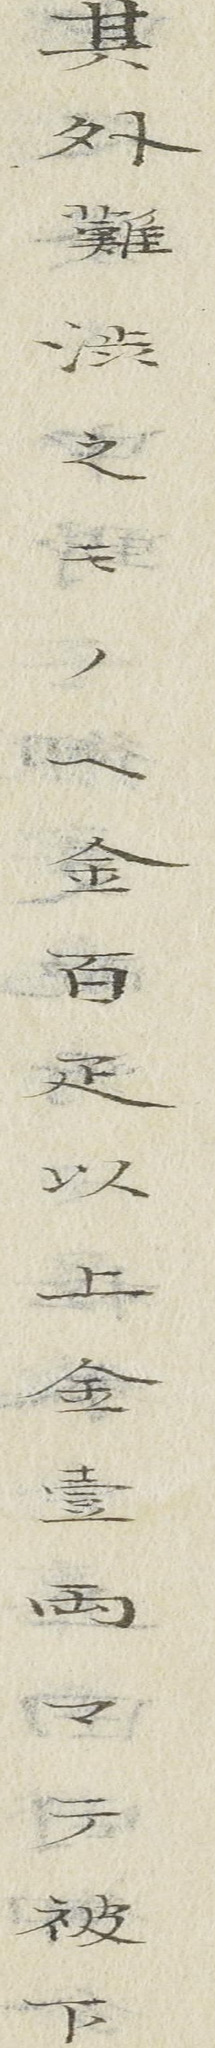其外難渋之モノヘ金百疋以上金壱両マテ被下
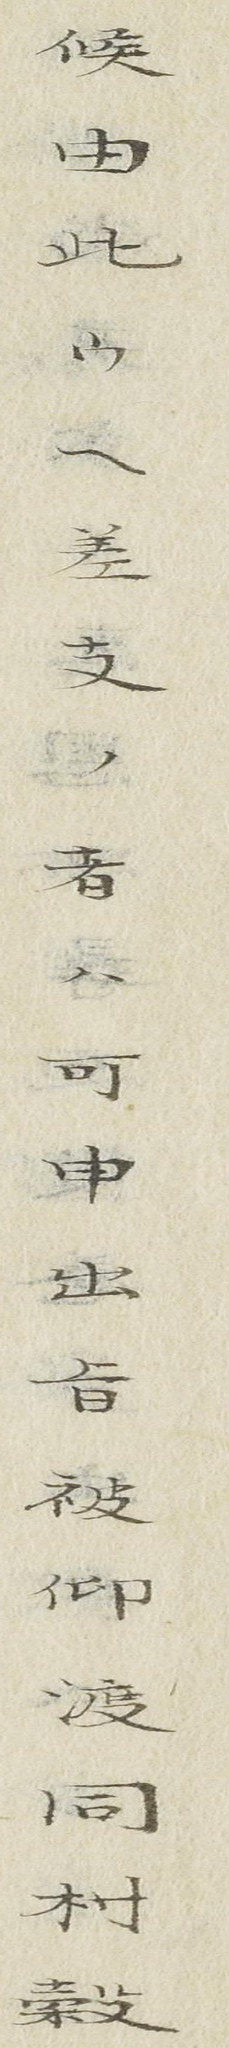候由此ウヘ差支ノ者ハ可申出旨被仰渡同村穀
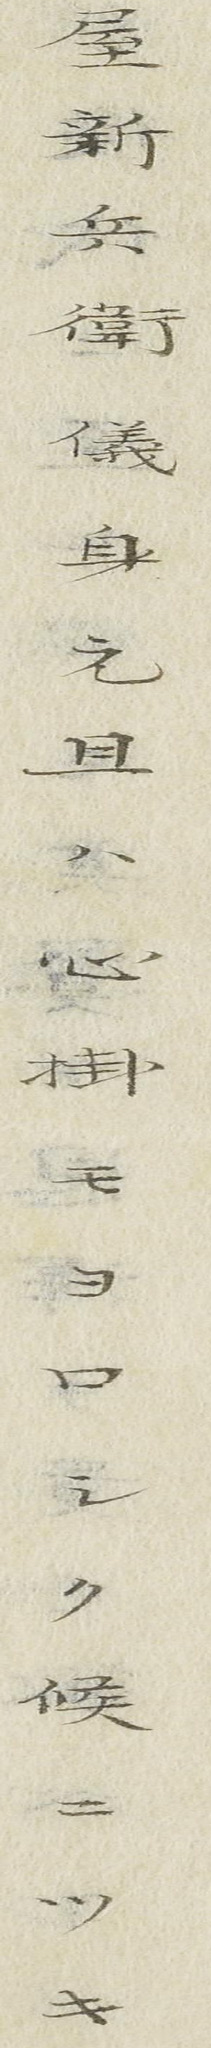屋新兵衛儀身元且ハ心掛モヨロシク候ニツキ
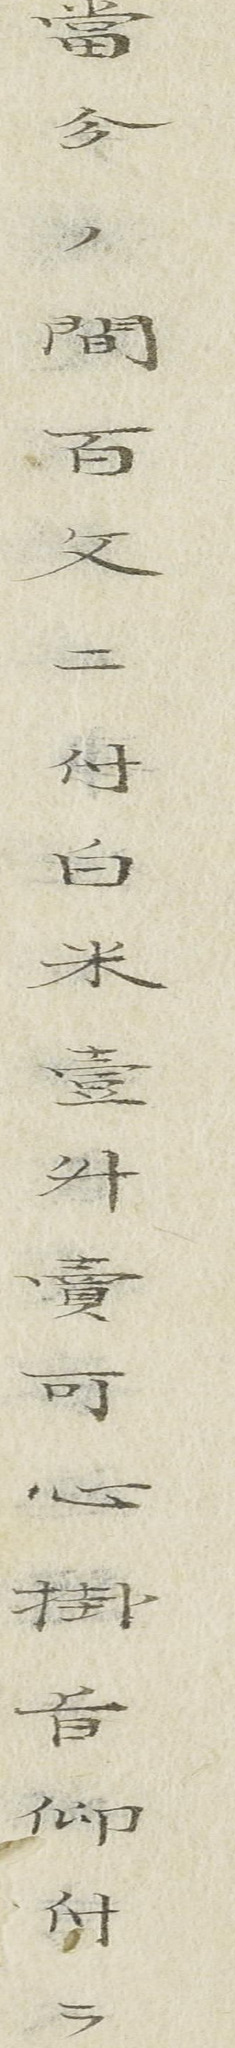当分ノ間百文ニ付白米壱升売可心掛旨仰付ラ
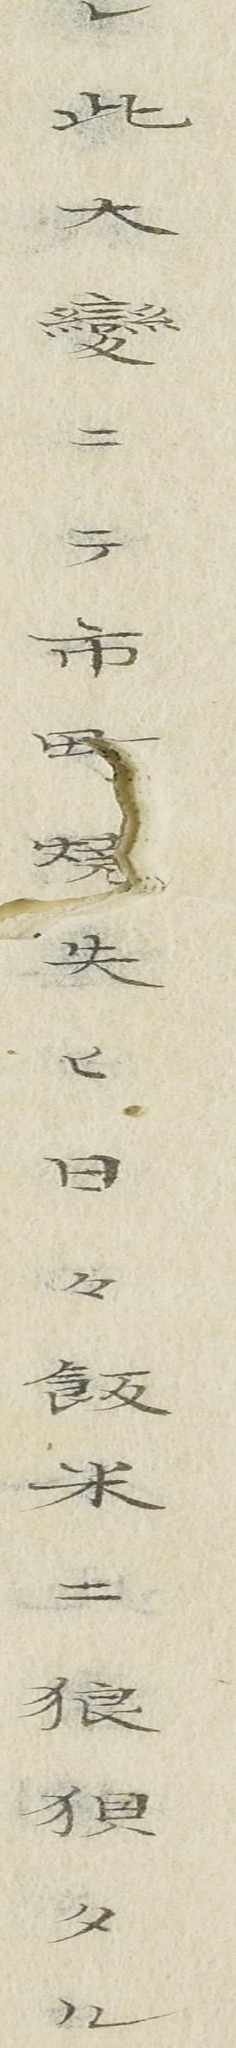レ此大変ニテ市町焼失ヒ日々飯米ニ狼狽タル

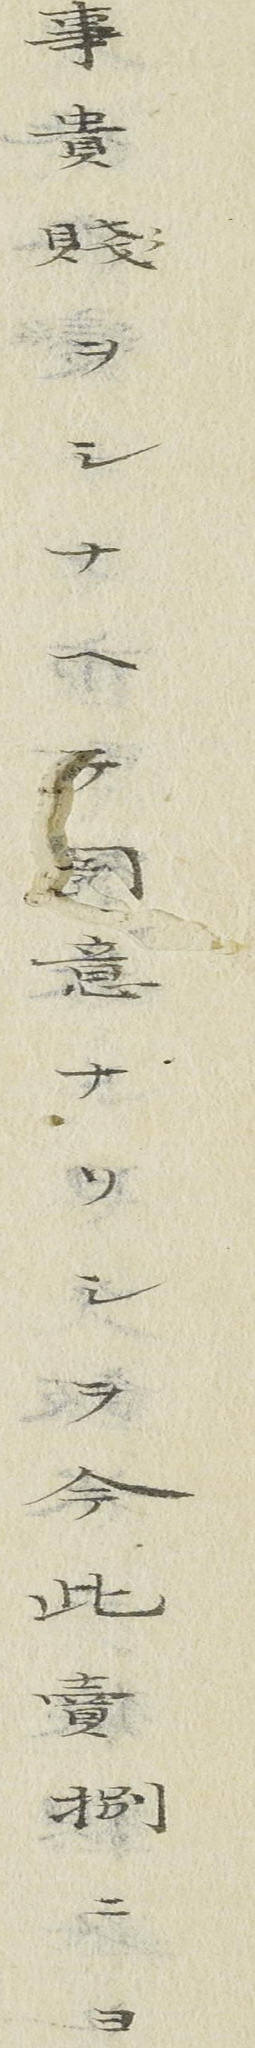事貴賤ヲシナヘテ同意ナリシヲ今此売捌ニヨ
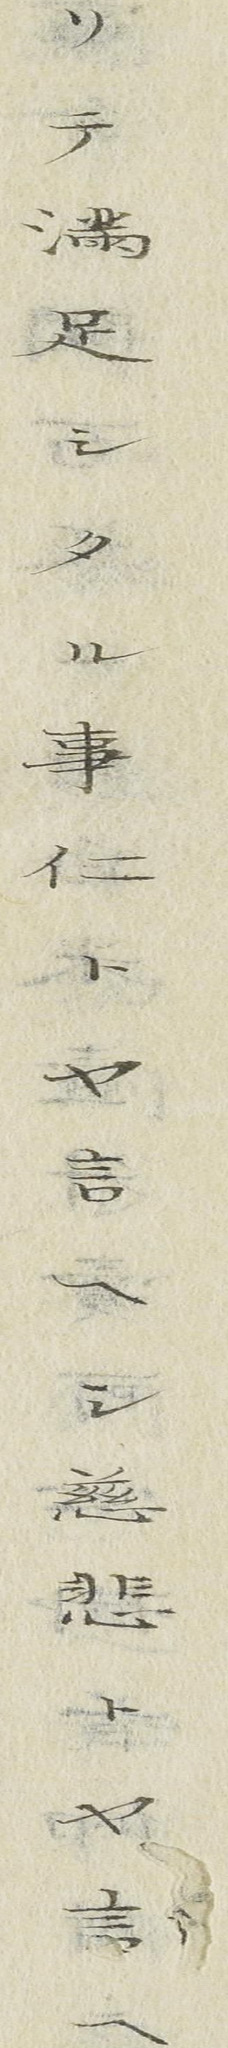リテ満足シタル事仁トヤ言ヘシ慈悲トヤ言ヘ
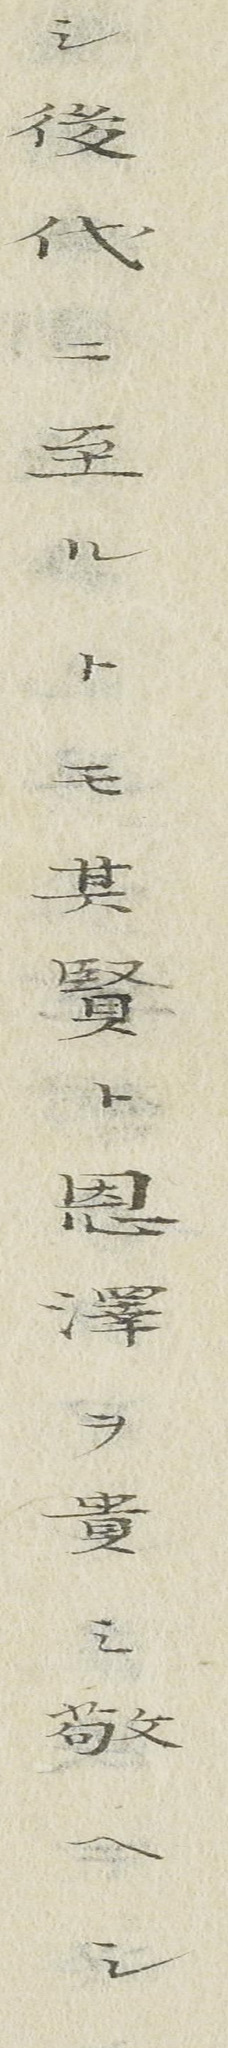シ後代ニ至ルトモ其賢ト恩沢ヲ貴ミ敬ヘシ
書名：地災撮要　地震之部　巻ノ二
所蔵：東京大学地震研究所図書室 Earthquake Research Institute Library, The University of Tokyo, JAPAN
